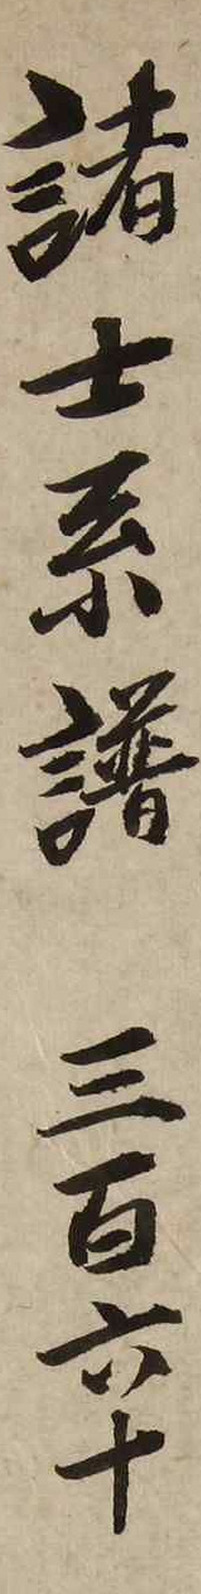諸士系譜三百六十

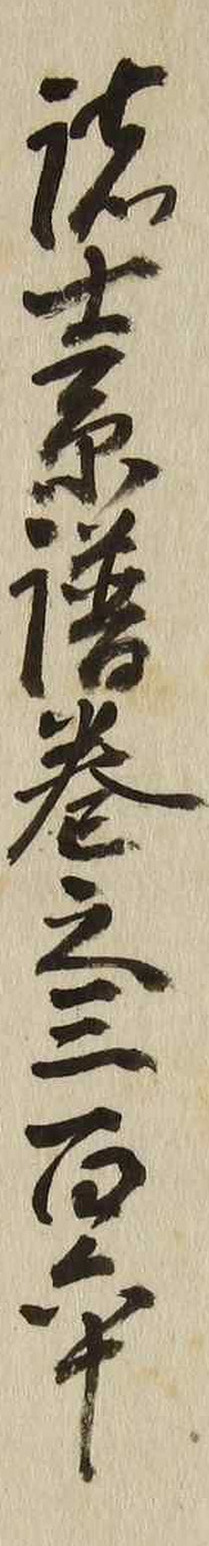諸士系譜巻之三百六十
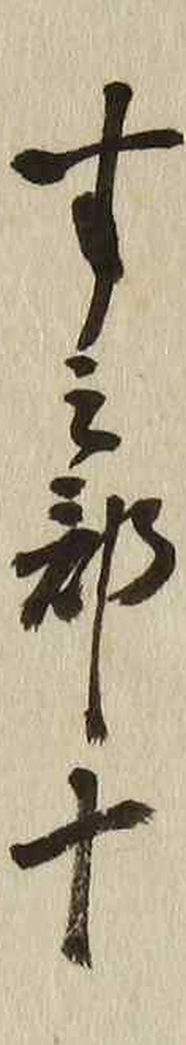す之部十
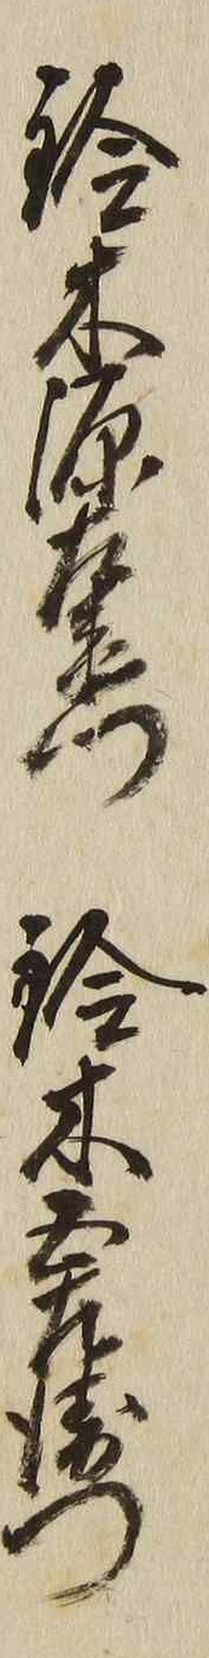鈴木源左衛門鈴木五左衛門

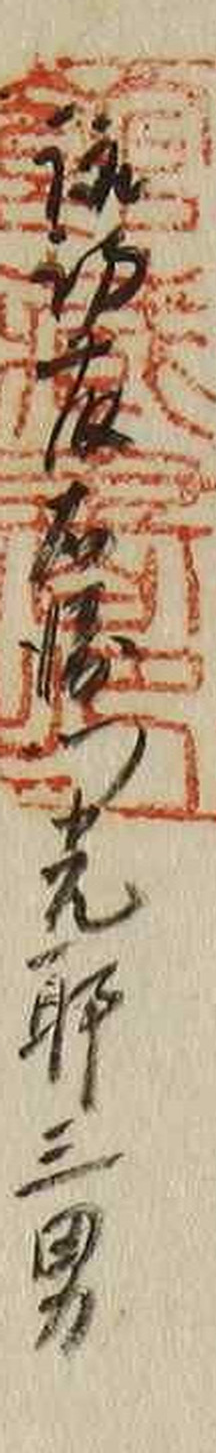諏訪藤右衛門光耶三男
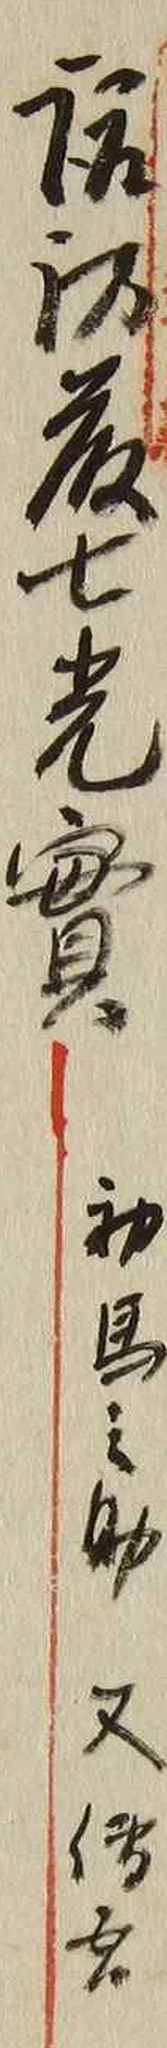諏訪藤七光実初馬之助又伝吾
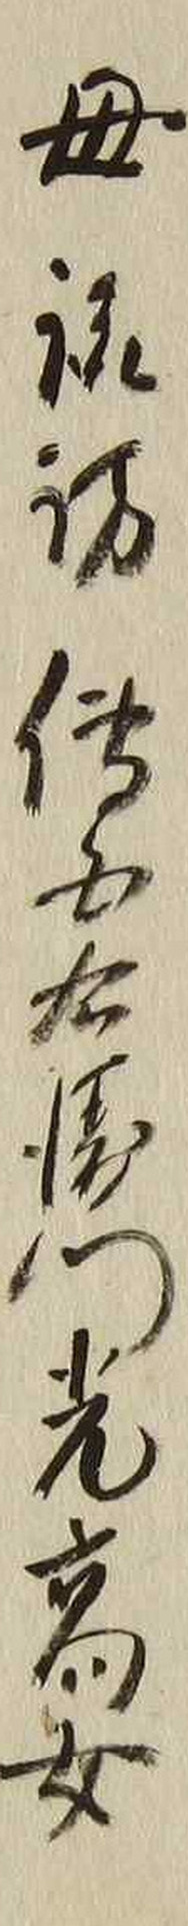母諏訪伝五右衛門光高女
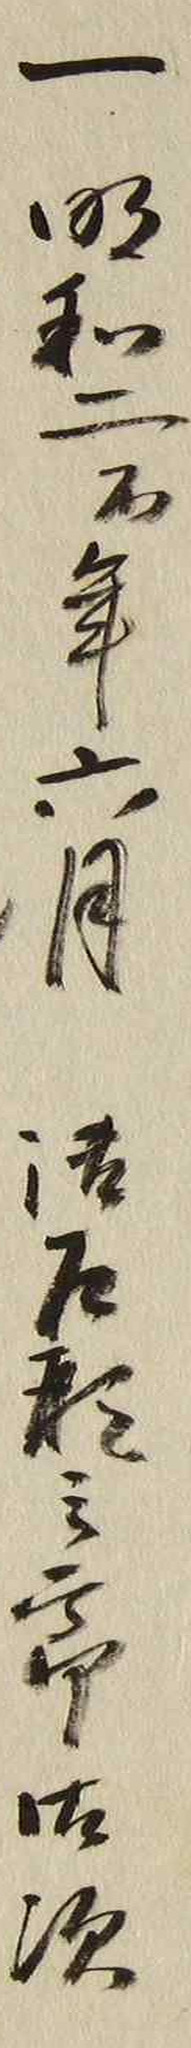一明和二酉年六月御召形之節御次
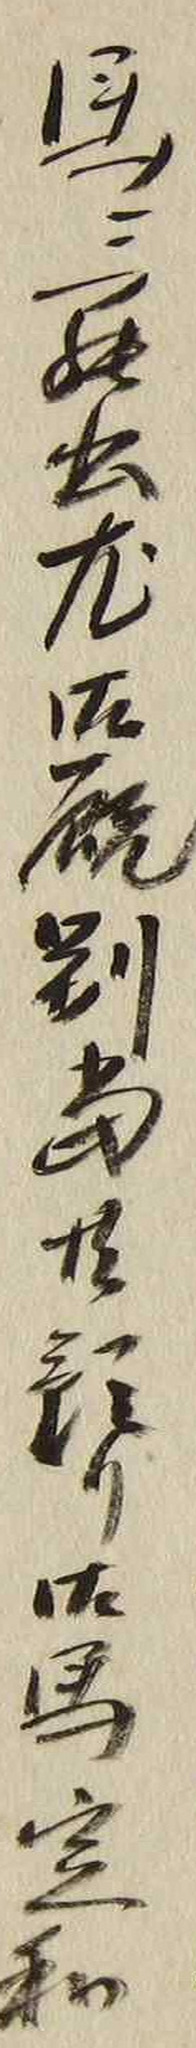馬に罷出尤御厩別当共預り御馬定和
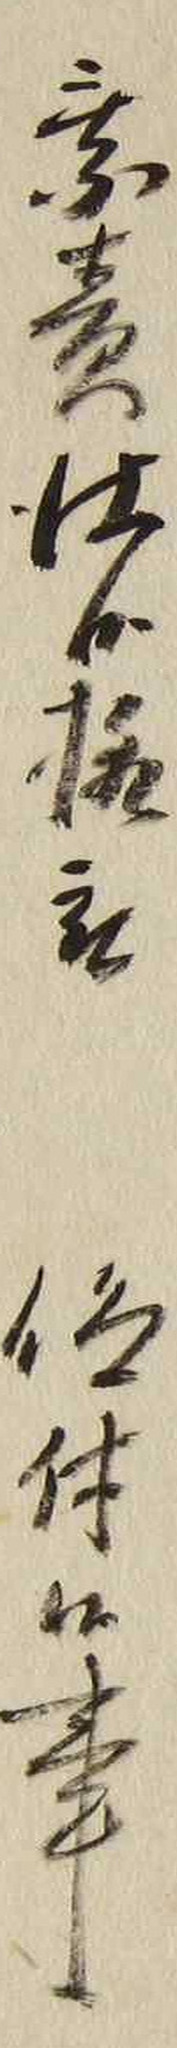乗責仕候様被仰付候事
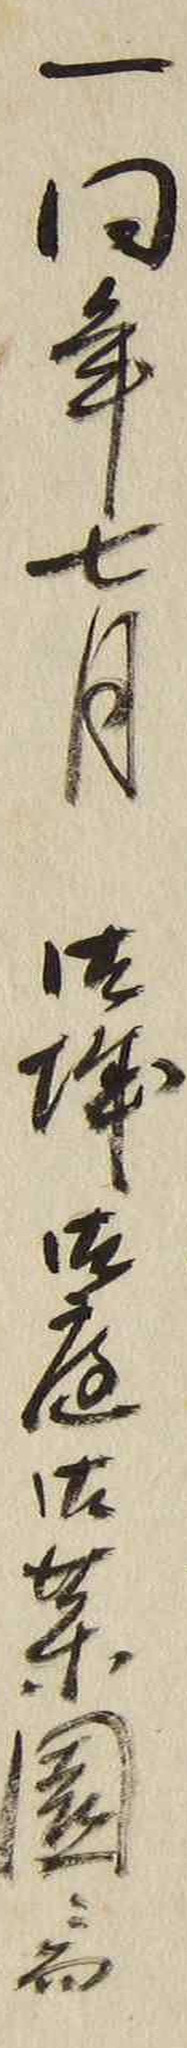一同年七月御城御庭御茶園に而

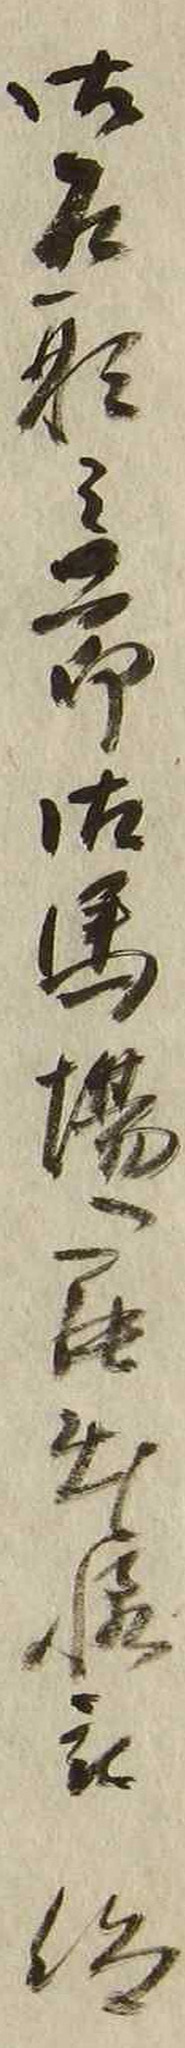御召形之節御馬場へ罷出候様被仰
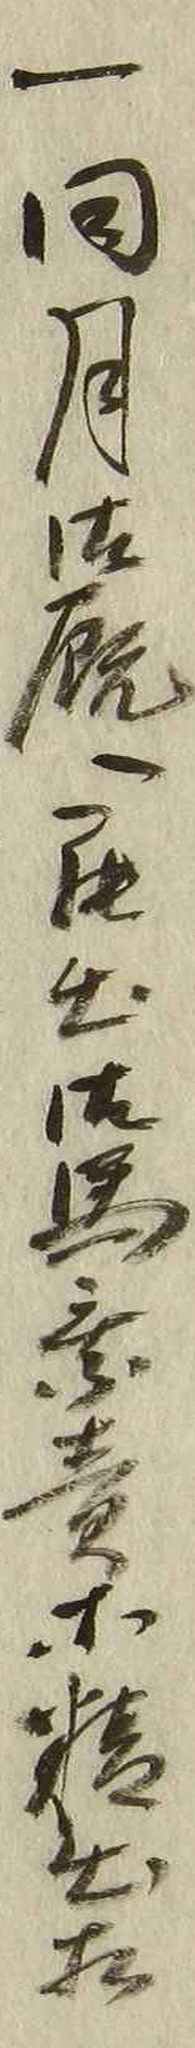一同月御厩へ罷出御馬乗責等精出相
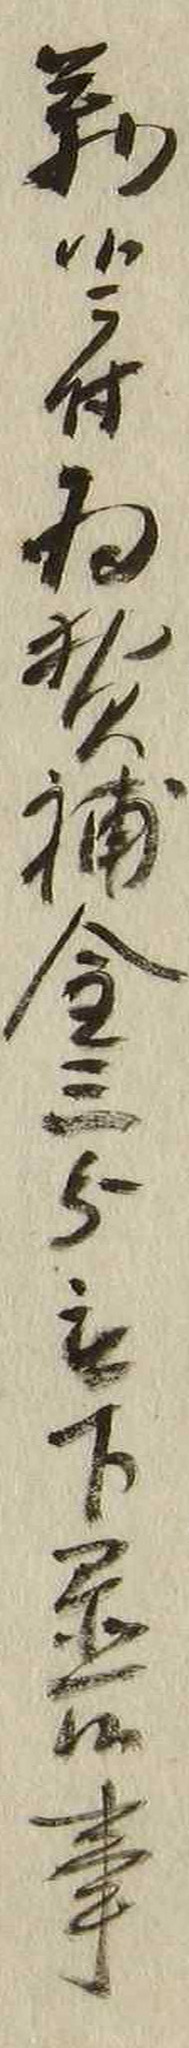勤候に付為賛補金三分被下置候事
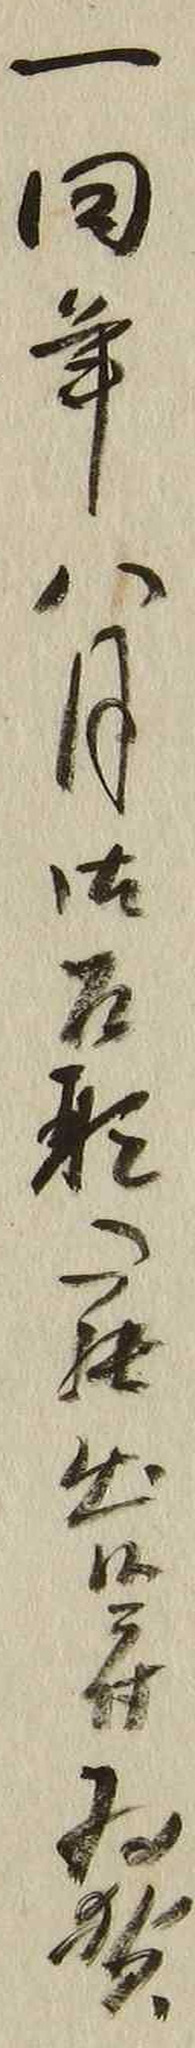一同年八月御召形へ罷出候に付為賛
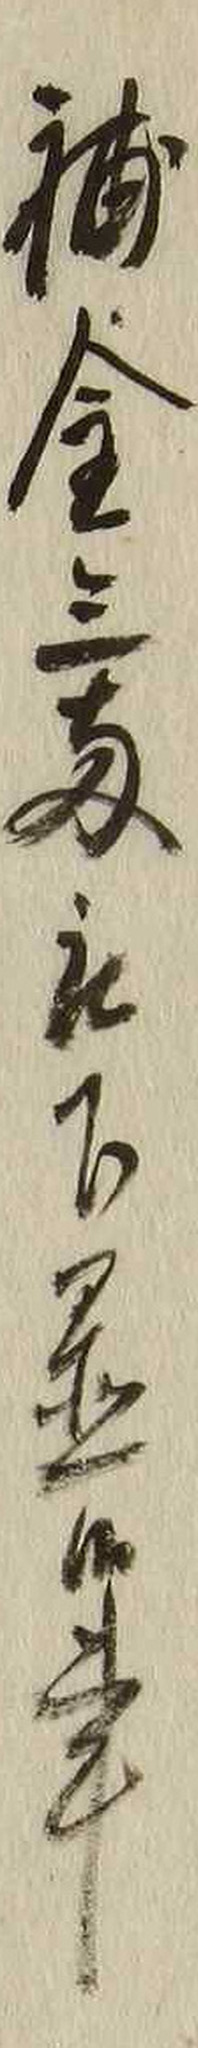補金三両被下置候事
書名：諸士系譜　巻之360　す之部10
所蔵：会津若松市立会津図書館
